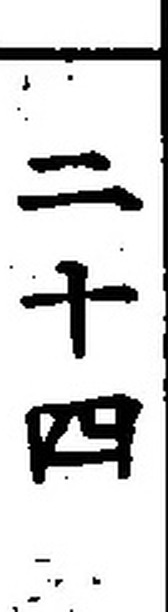二十四

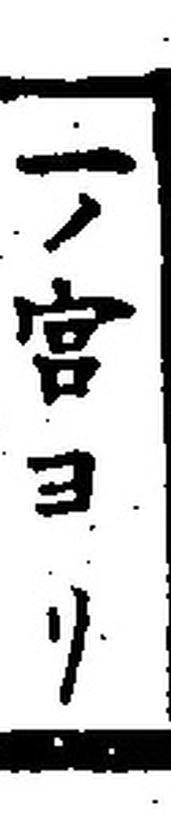一ノ宮ヨリ
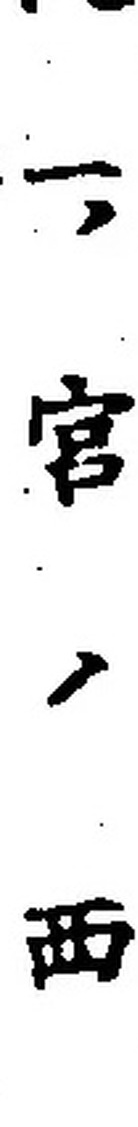一ノ宮ヨリ
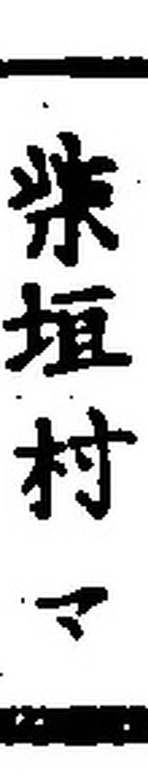柴垣村マ
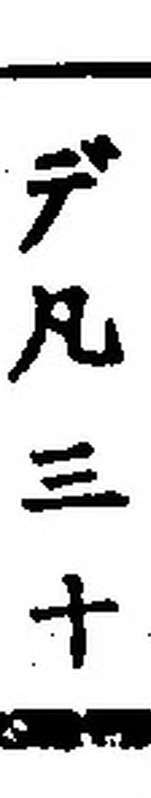デ凡三十
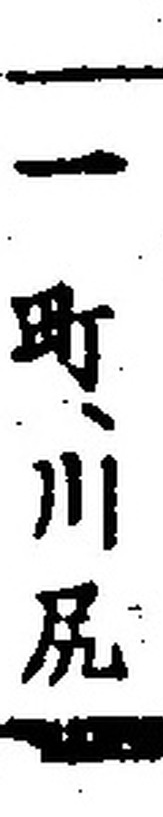一町、川尻
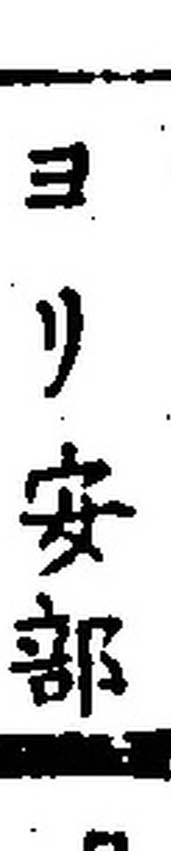ヨリ安部
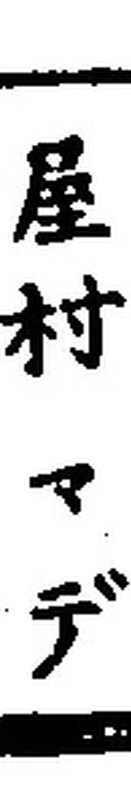屋村マデ
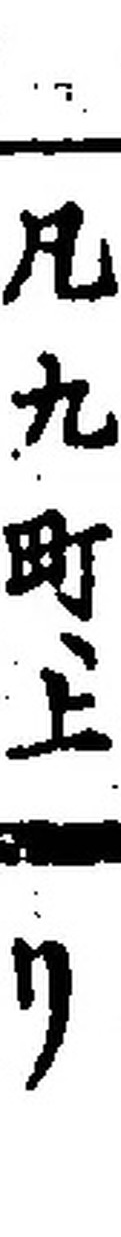凡九町、上
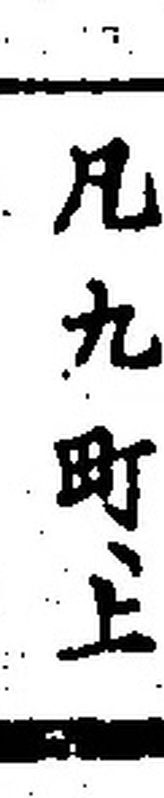凡九町、上
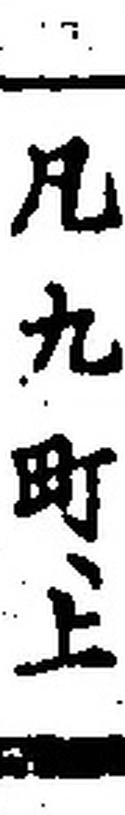凡九町、上
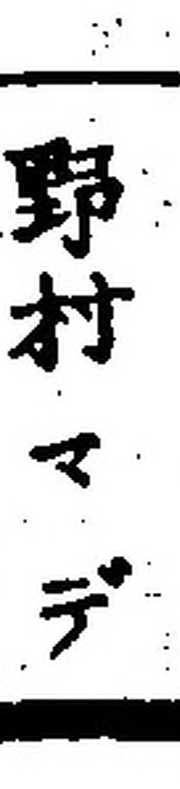野村マデ
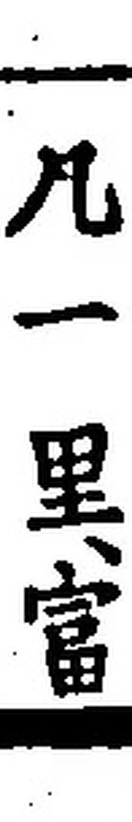凡一里、富
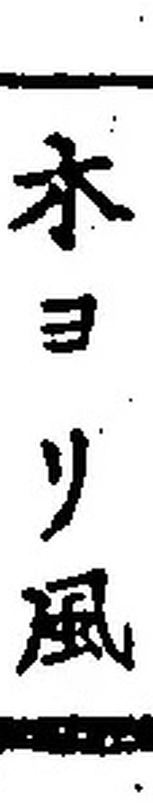木ヨリ風
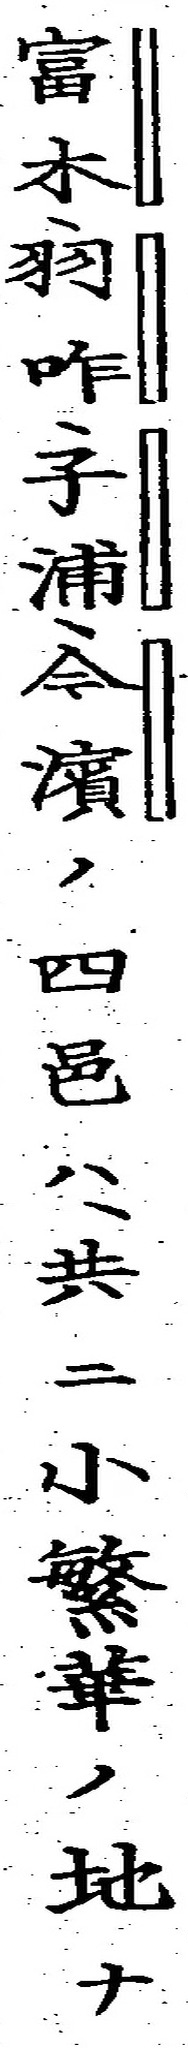富木・羽咋・子浦・今浜ノ四邑ハ、共ニ小繁華ノ地ナ
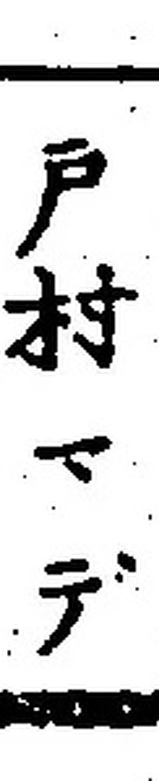戸村マデ
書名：能登地誌略
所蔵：国立国会図書館 National Diet Library, JAPAN
